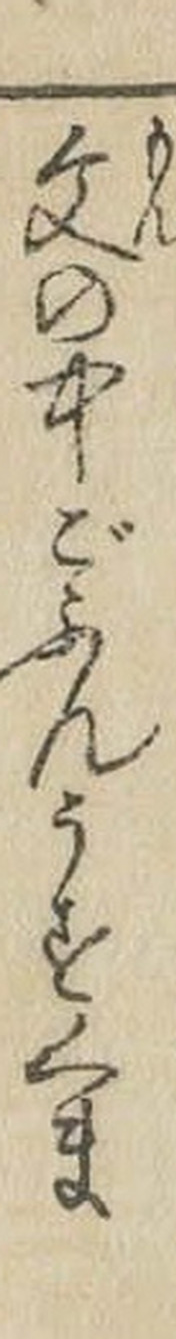文の中ごふんうすくま
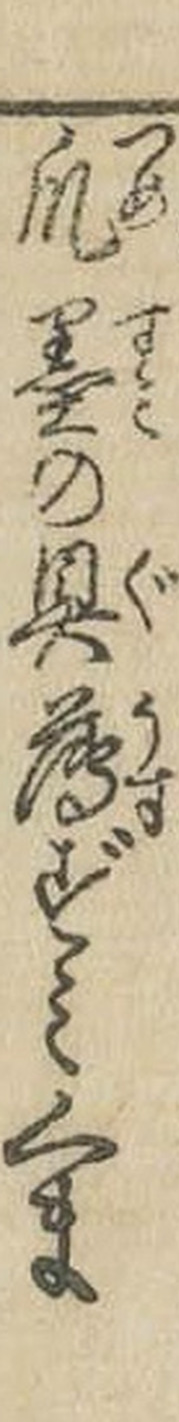爪墨の具薄ずみくま
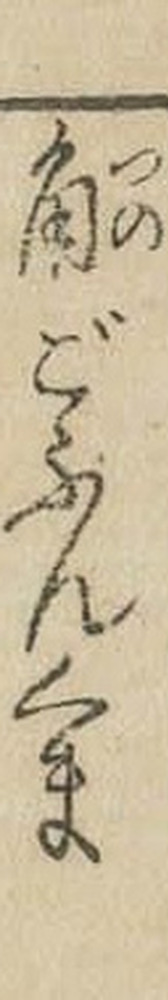角ごふんくま
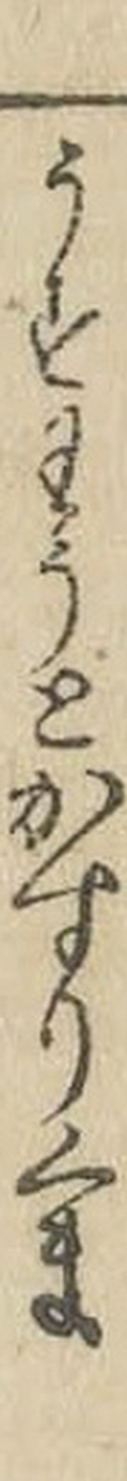うすわうとかすりくま

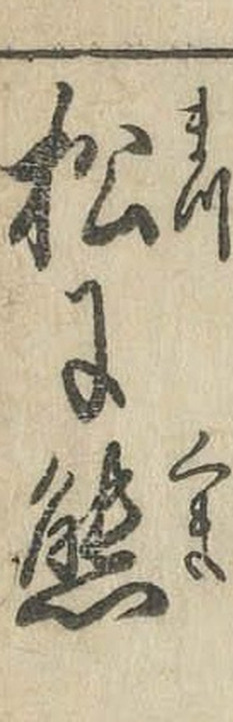松に熊

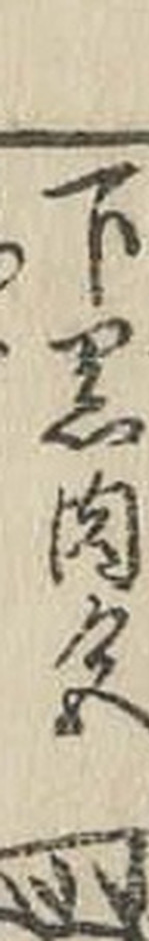下墨肉色
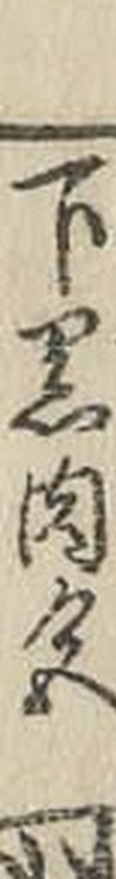下墨肉色
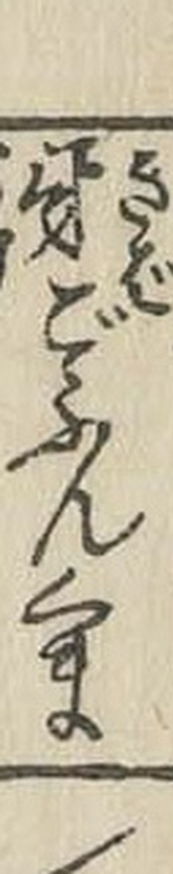牙ごふんくま
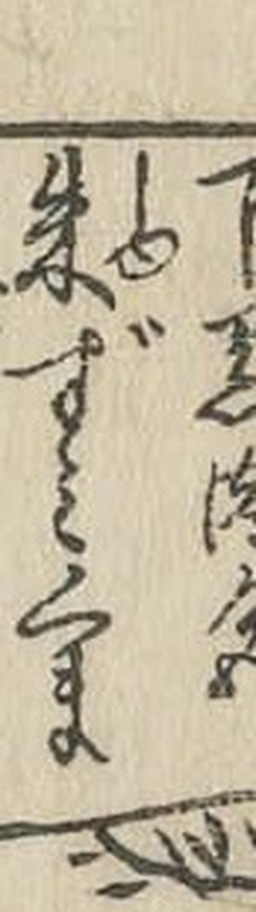朱ずみくま
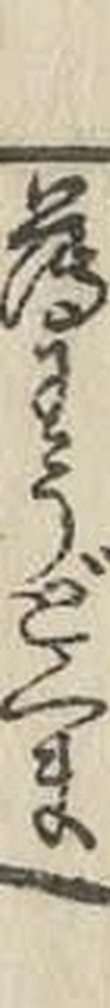薄わうどくま
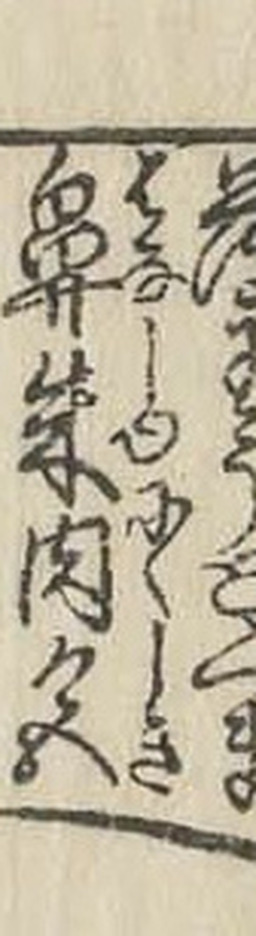鼻朱肉色
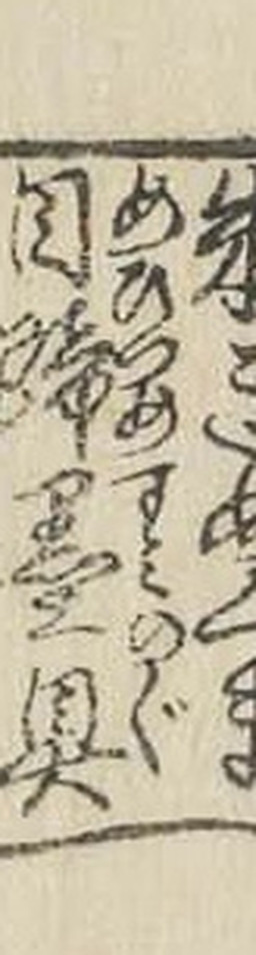目蹄墨具
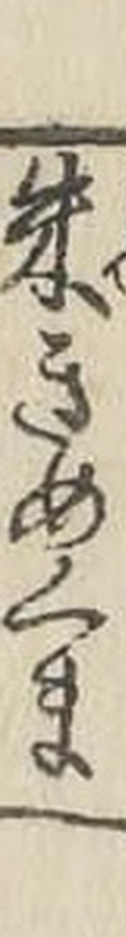朱きめくま
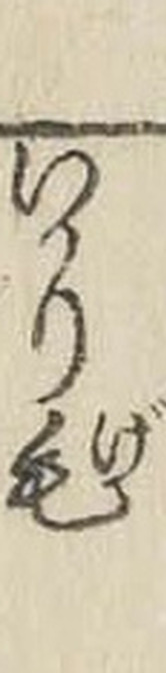いかり毛
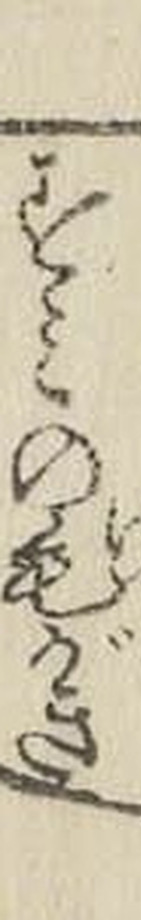すみの毛がき
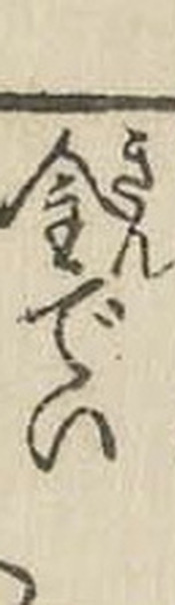金でい
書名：絵本写宝袋 9巻 9之巻上
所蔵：東京学芸大学教育コンテンツアーカイブ
